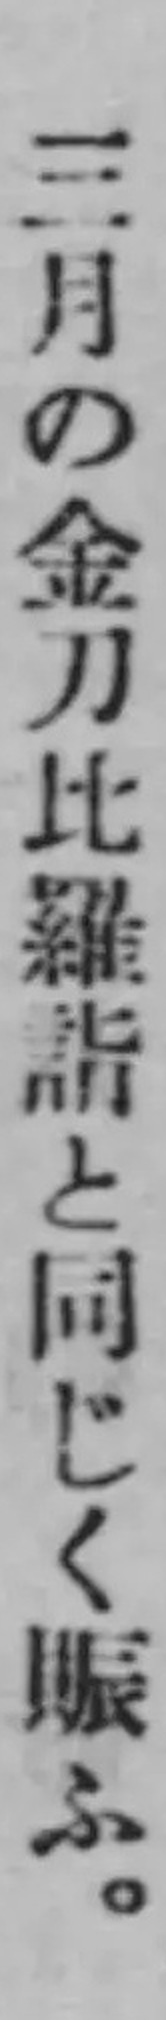三月の金刀比羅詣と同じく賑ふ。

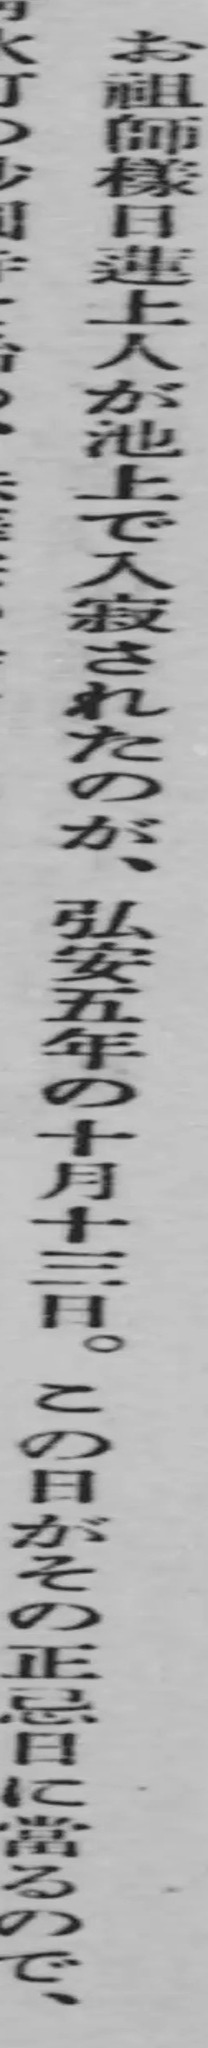お祖師様日蓮上人が池上で入寂されたのが、弘安五年の十月十三日。この日がその正忌日に當るので、
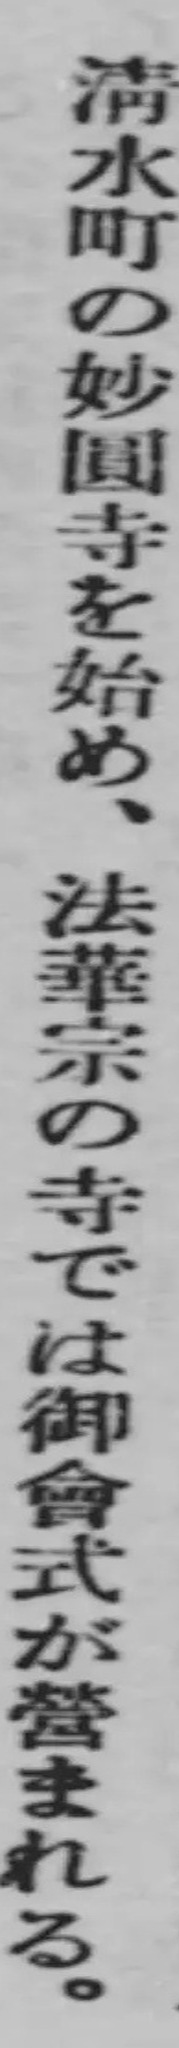淸水町の妙圓時を始め、法華宗の寺では御會式が營まれる。
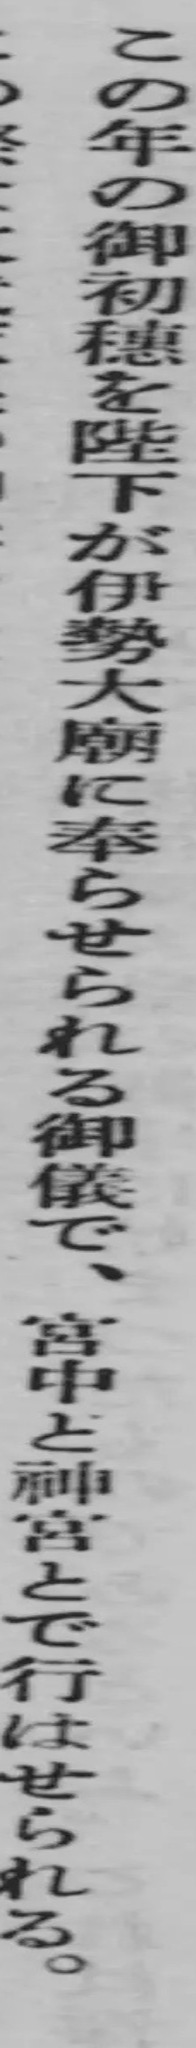この年の御初穗を陛下が伊勢大廟に奉らせられる御儀で、宮中と神宮とで行はせられる。
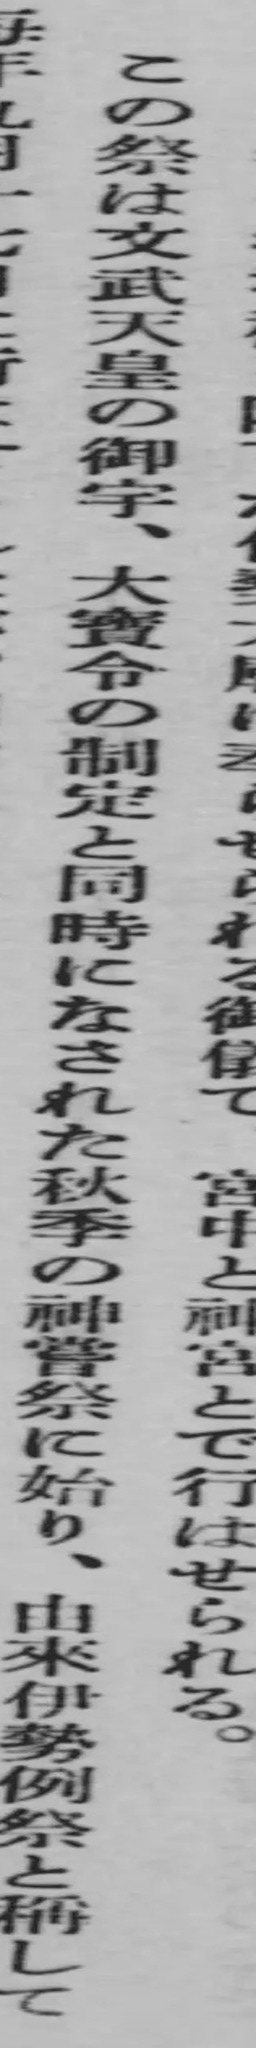この祭は文武天皇の御宇、大寶令の制定と同時になされた秋季の神嘗祭に始り、由來伊勢例祭と稱して
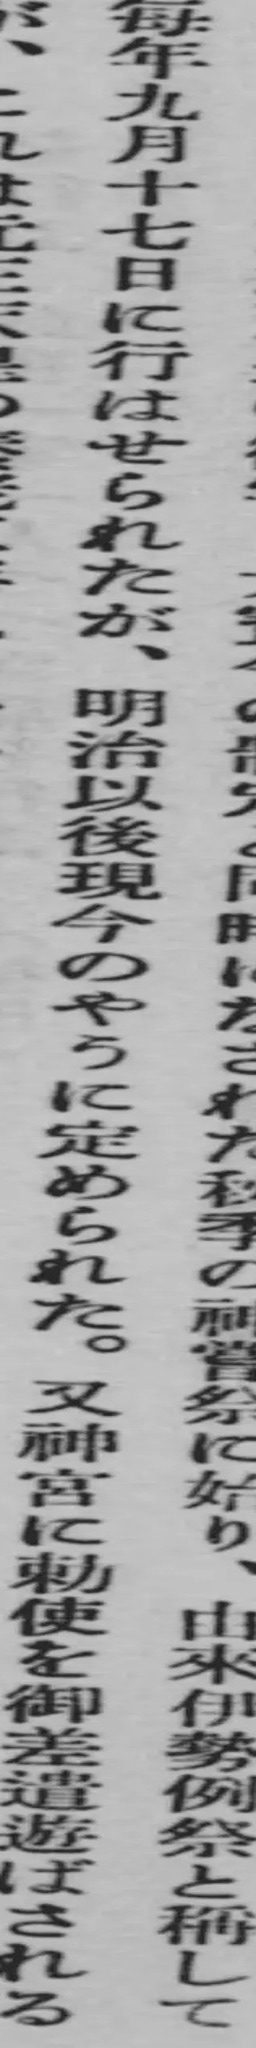每年九月十七日に行はせられたが、明治以後現今のやうに定められた。又神宮に勅使を御差遣遊ばされる
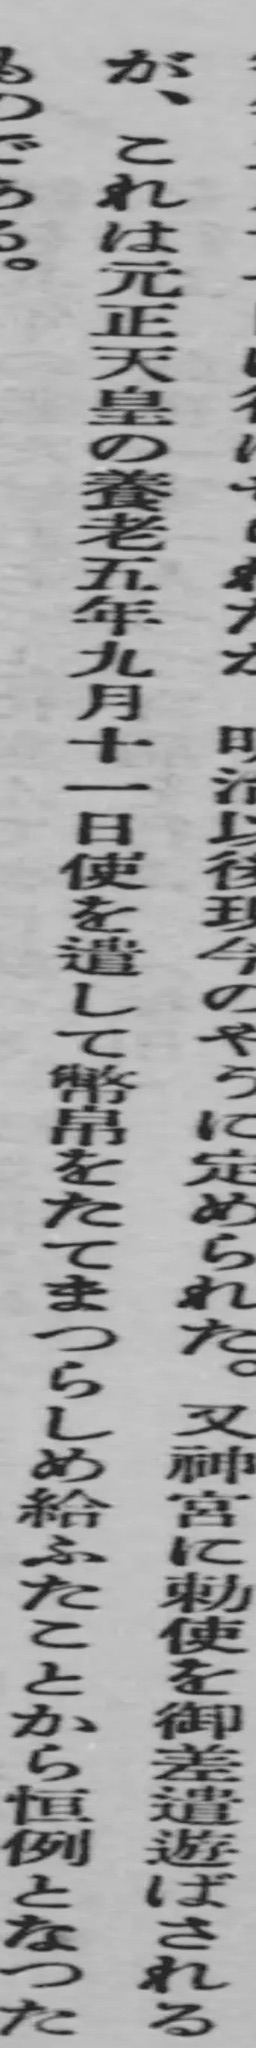が、これは元正天皇の養老五年九月十一日使を遣して幣帛をたてまつらしめ給ふたことから恒例となつた
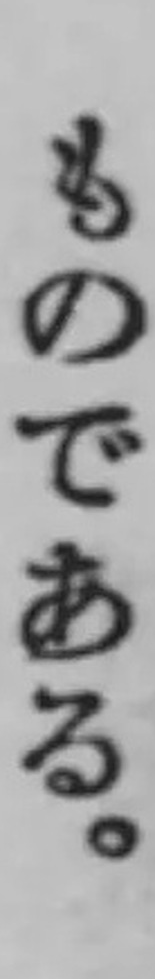ものである。
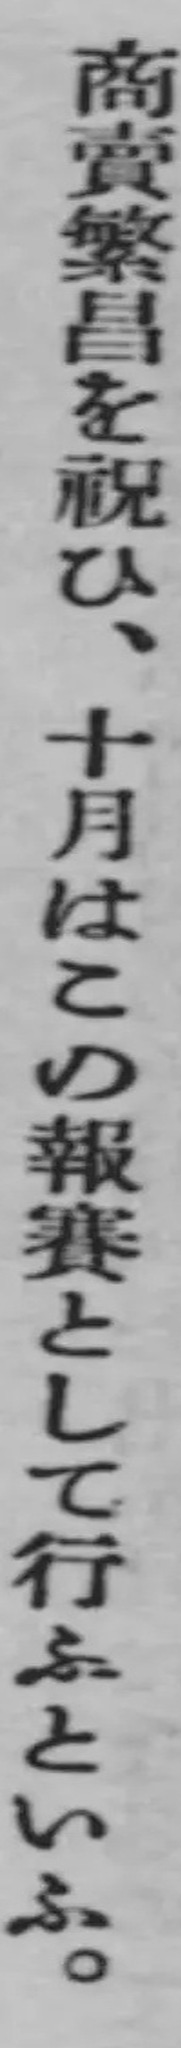商賣繁昌を祝ひ、十月はこの報賽として行ふといふ。
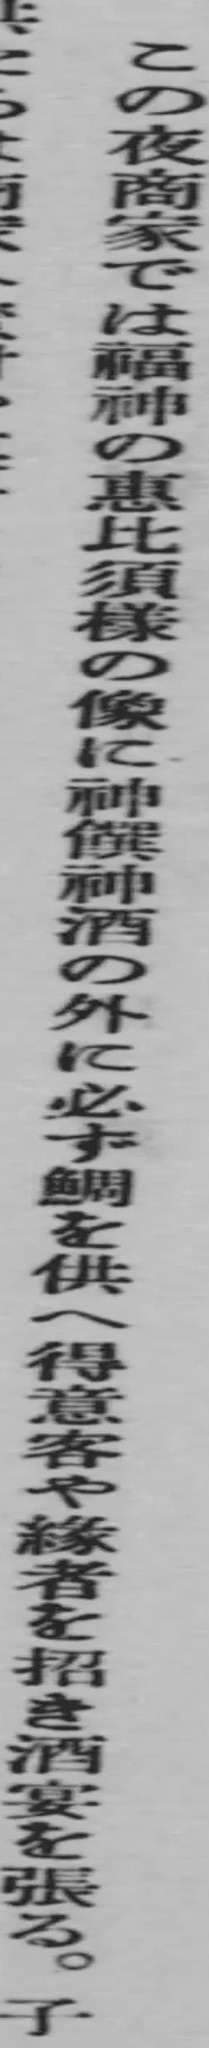この夜商家では福神の惠比須様の像に神僎神酒の外に必ず鯛を供へ得意客や緣者を招き酒宴を張る。子
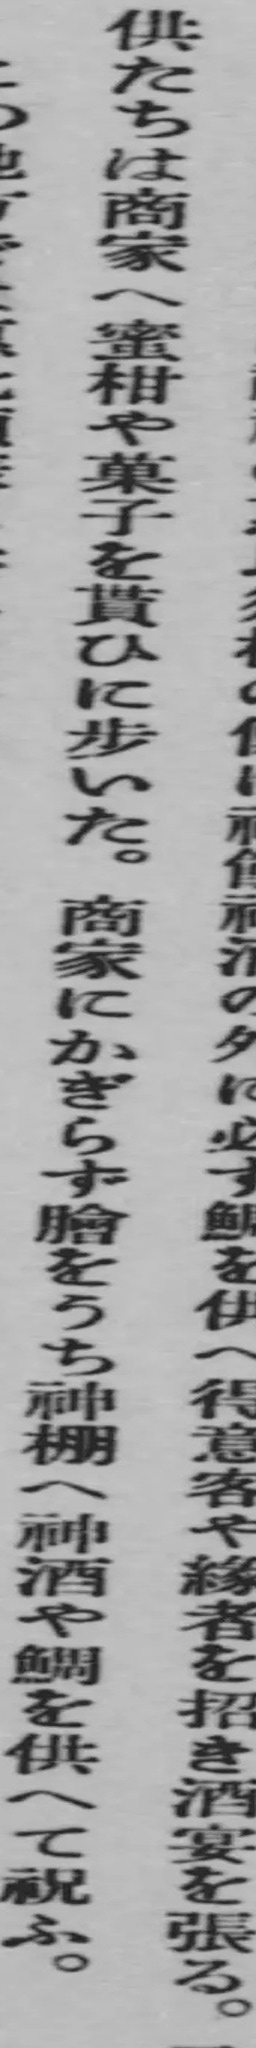供たちは商家へ蜜柑や菓子を貰ひに歩いた。商家にかぎらず膾をうち神棚へ神酒や鯛を供へて祝ふ。
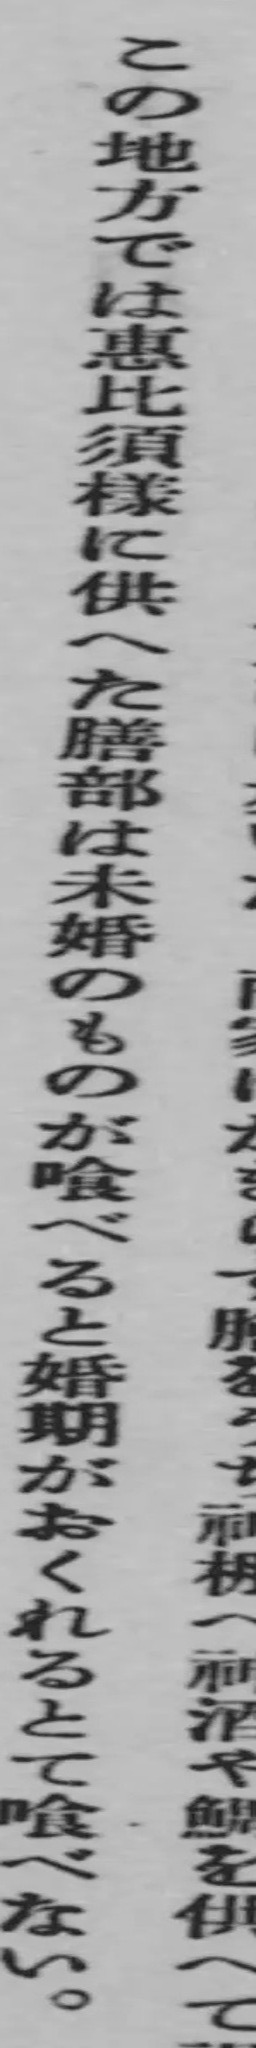この地方では惠比須様に供へた膳部は未婚のものが喰べると婚期がおくれるとて喰べない。
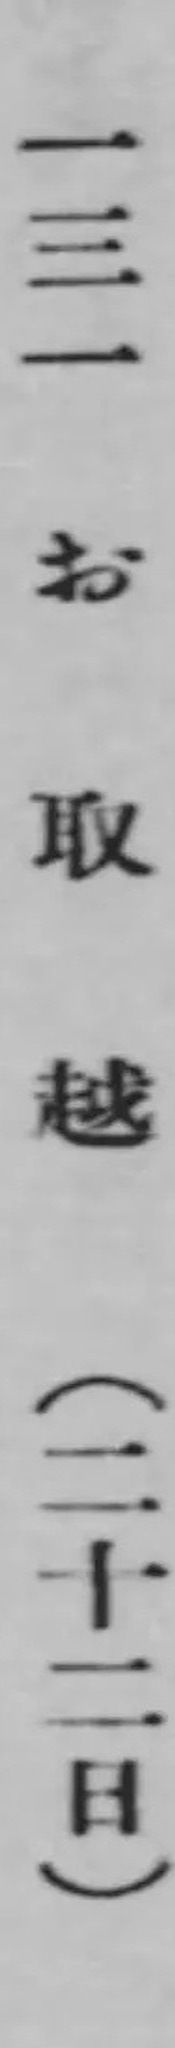一三一お取越(二十二日)
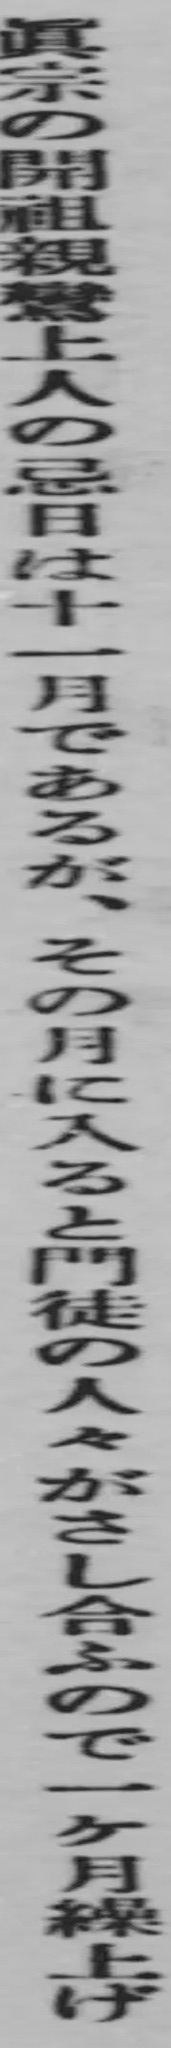眞宗の開祖親鸞上人の忌日は十一月であるが、その月に入ると門徒の人々がさし合ふので一ヶ月繰上げ
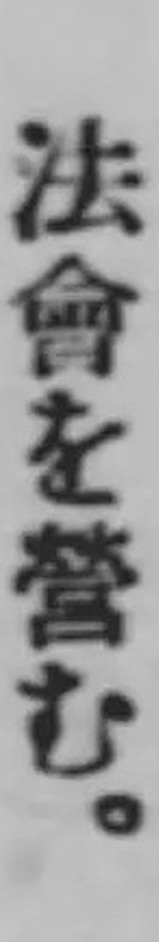法會を營む。
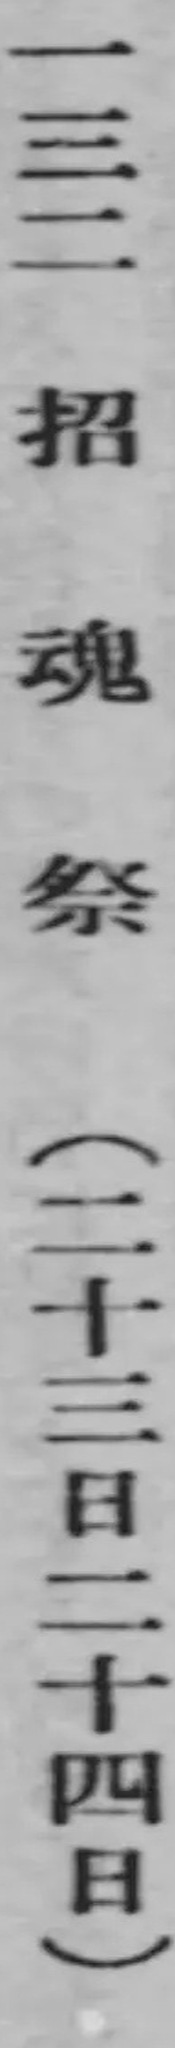一三二招魂祭(二十三日二十四日)
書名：豊橋の年中行事
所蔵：国立国会図書館 National Diet Library, JAPAN
